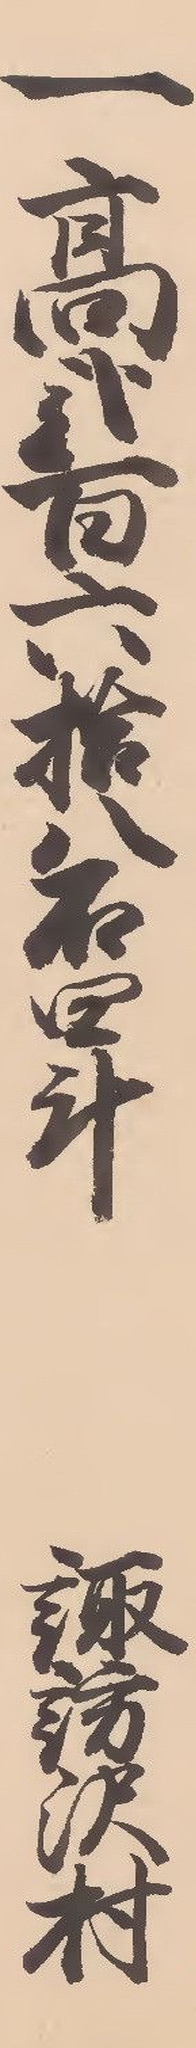一高弐百六拾八石四斗諏訪沢村
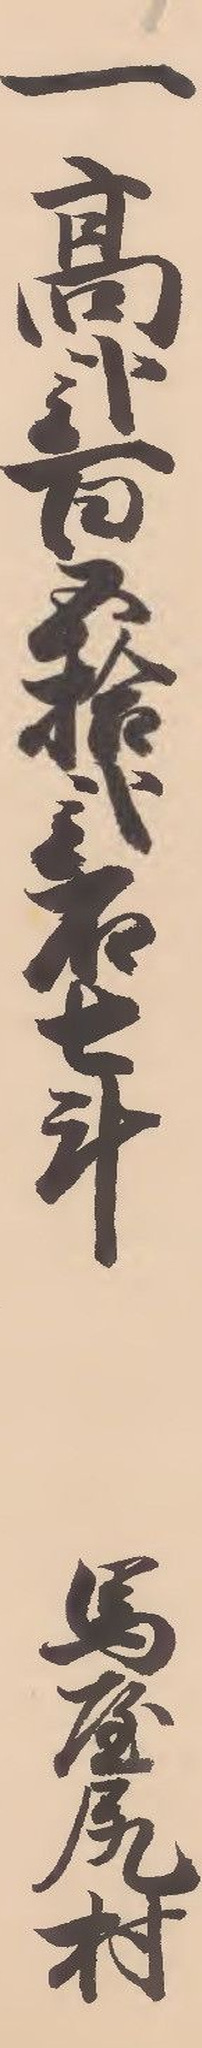一高弐百五拾弐石七斗馬屋尻村
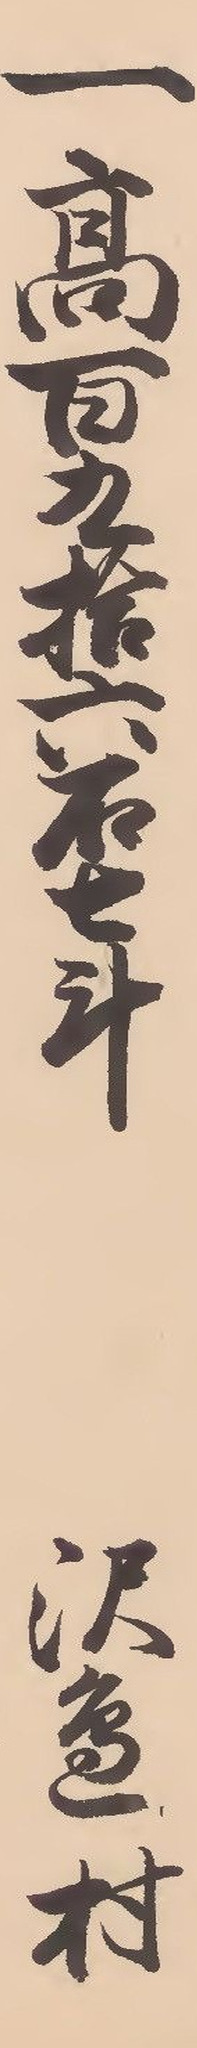一高百九拾六石七斗沢辺村
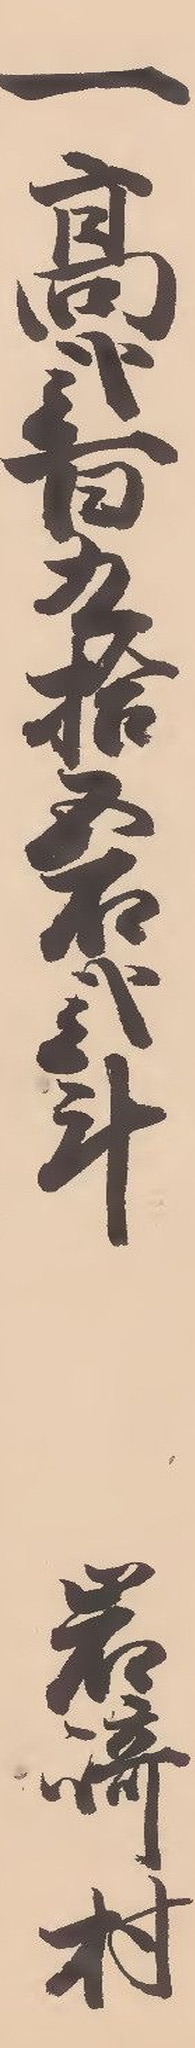一高弐百九拾五石弐斗岩崎村
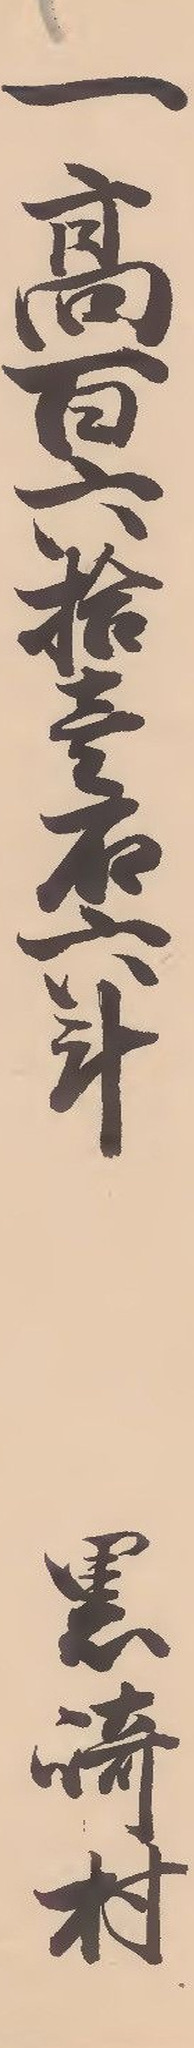一高百六拾壱石六斗黒崎村
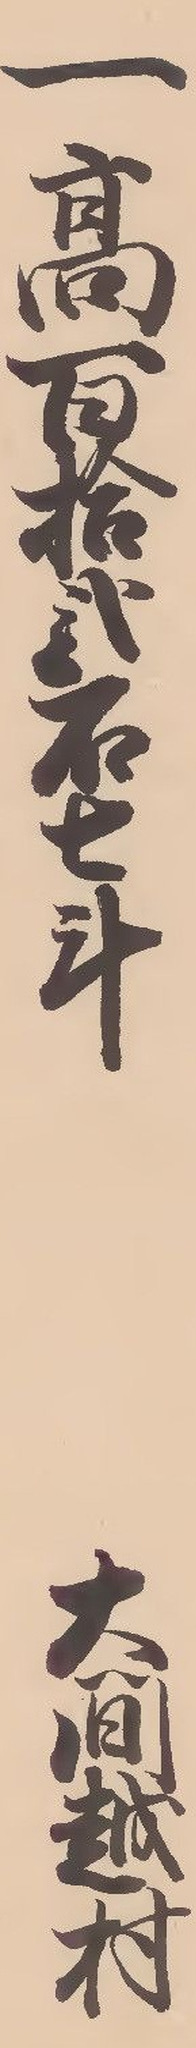一高百拾弐石七斗大間越村

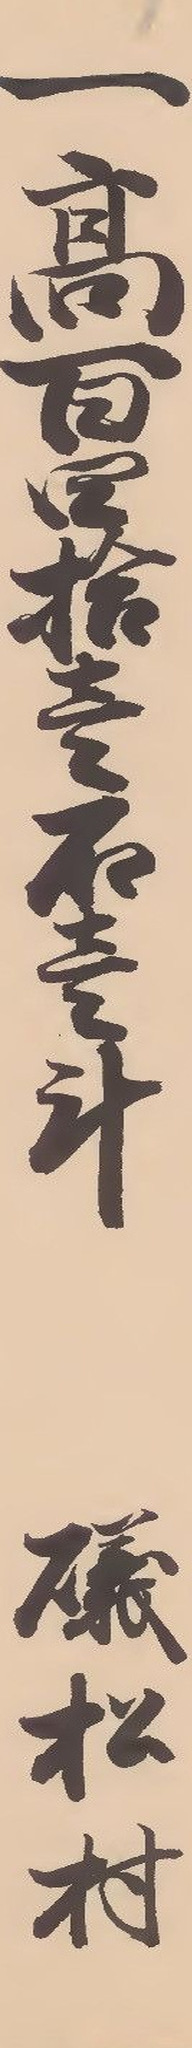一高百四拾壱石壱斗磯松村
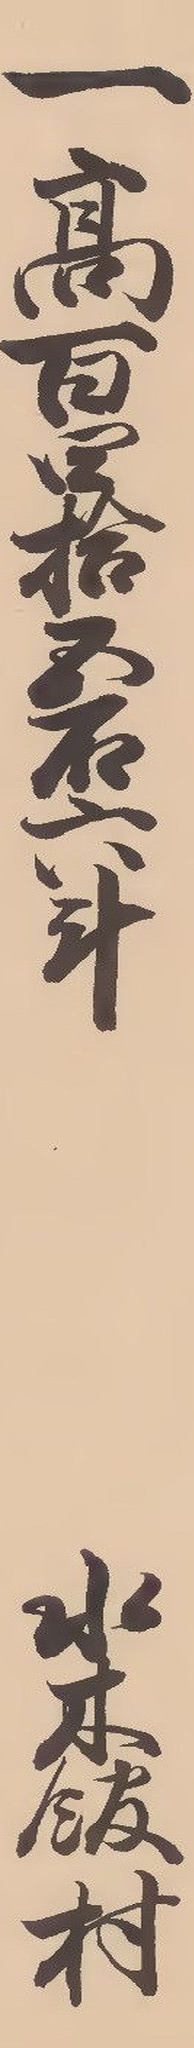一高百四拾五石六斗水木館村
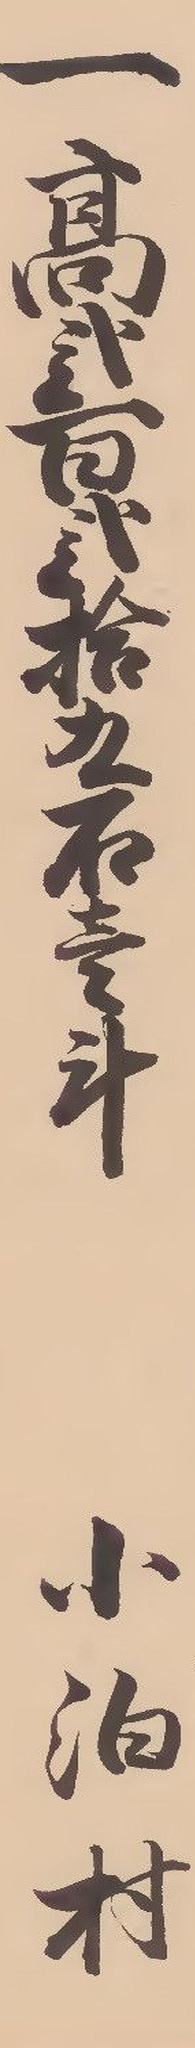一高弐百弐拾九石壱斗小泊村

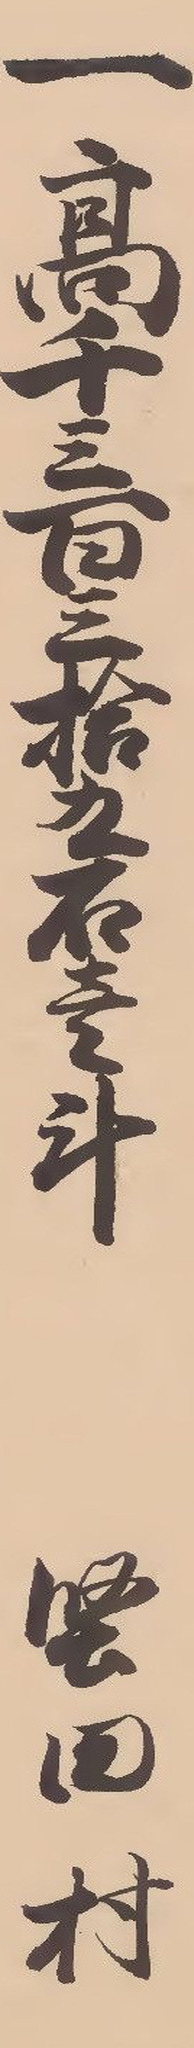一高千三百三拾九石壱斗堅田村
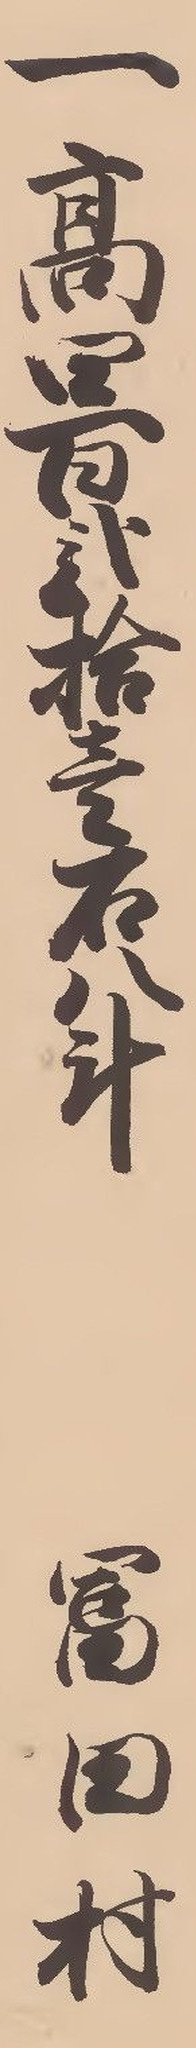一高四百弐拾壱石八斗富田村
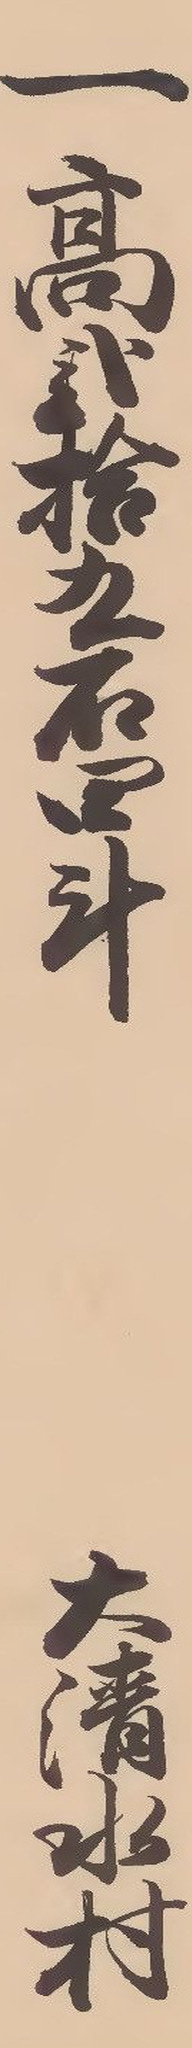一高弐拾九石四斗大清水村

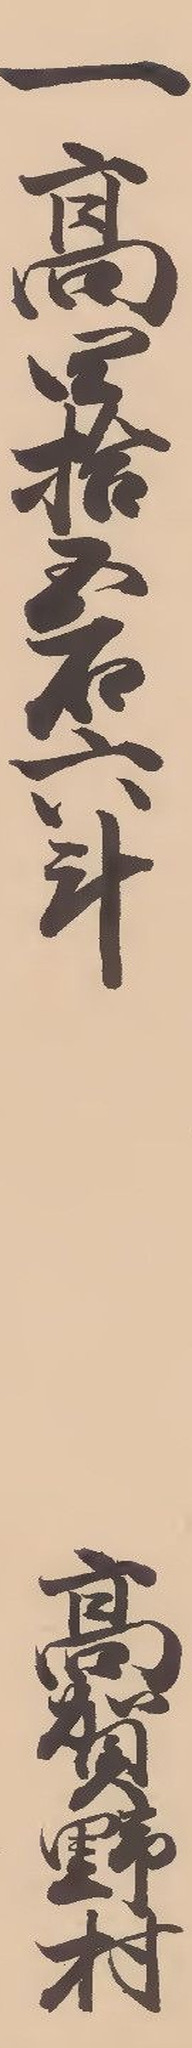一高四拾五石六斗高賀野村

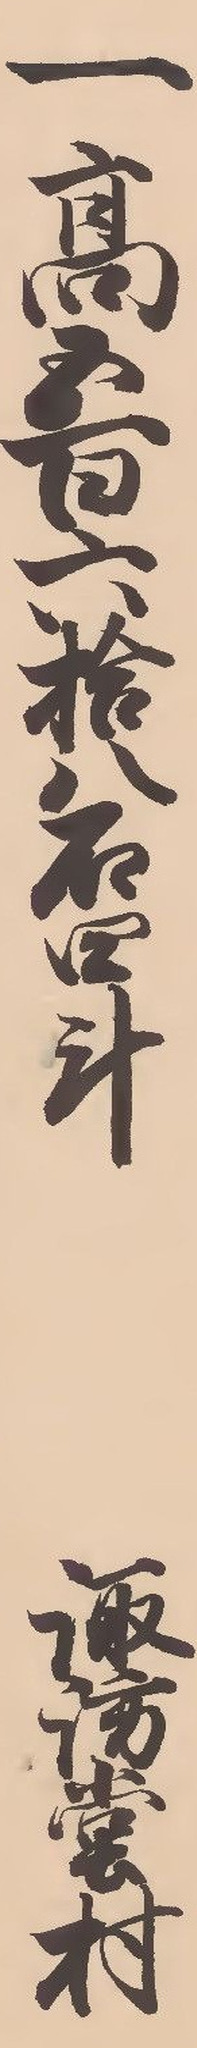一高五百六拾八石四斗諏訪堂村
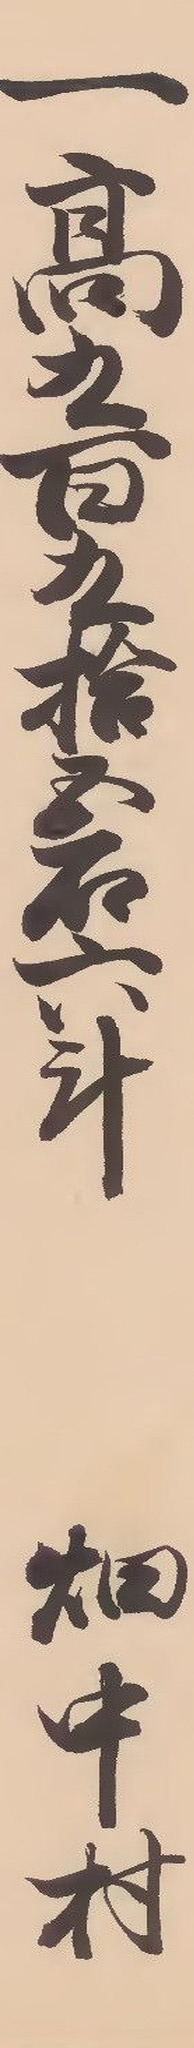一高九百九拾五石六斗畑中村
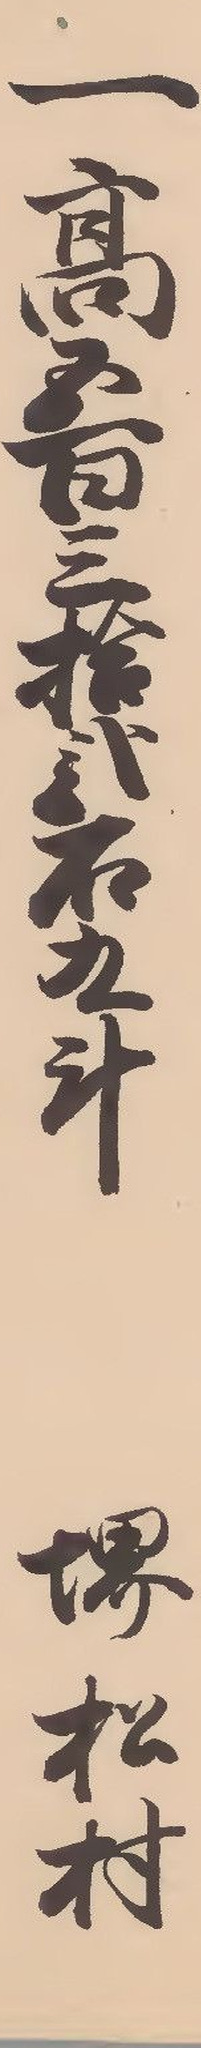一高五百三拾弐石九斗堺松村
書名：陸奥国郷帳　７
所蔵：国立公文書館 National Archives of Japan
